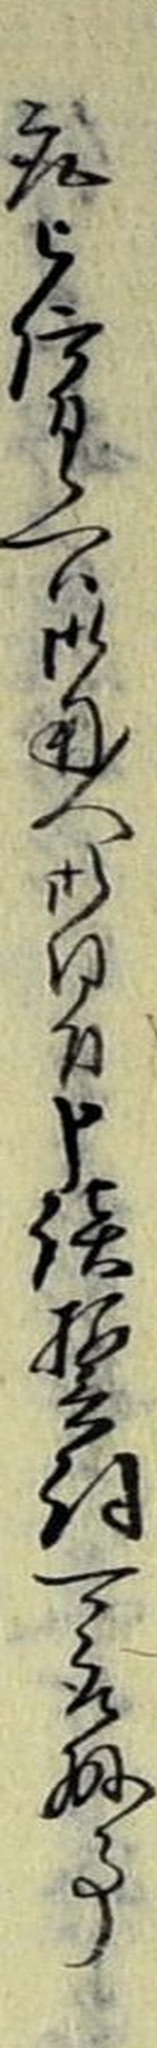取被仰付候へは御用人御目付申談誓詞可取扱事
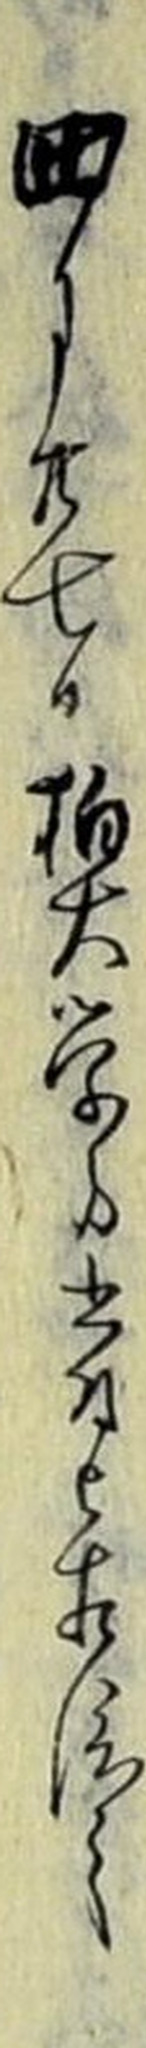四月廿七日狛大学方書付被相渡之
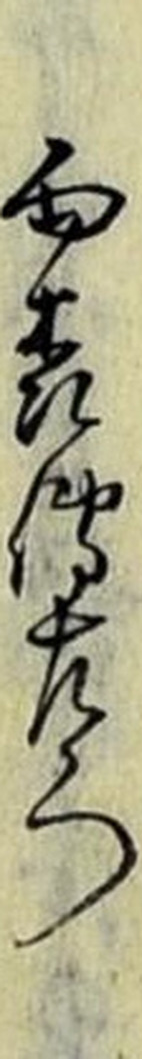雨森伝左衛門
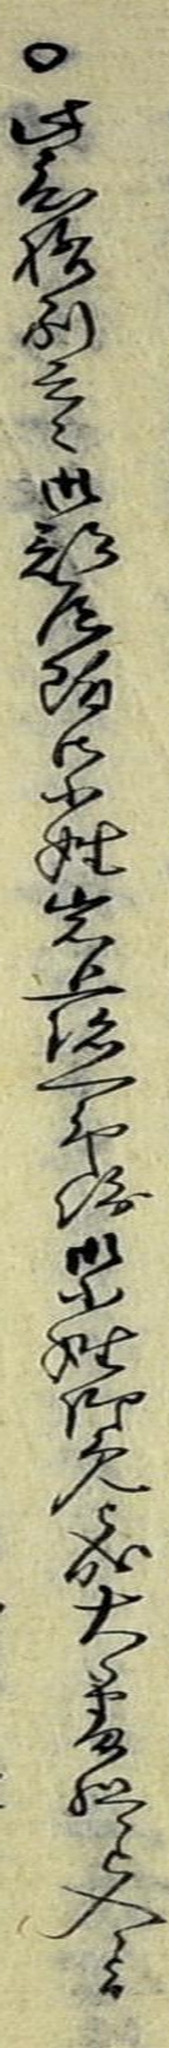〇此度格別云々御部屋附御小姓岩上銘一郎儀御小姓御免被成大番組へ被入候旨
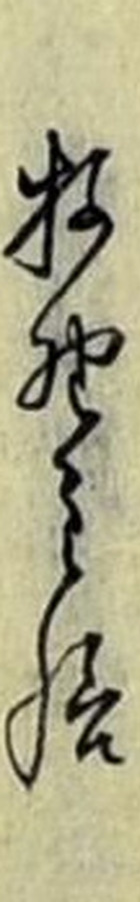牧野主膳
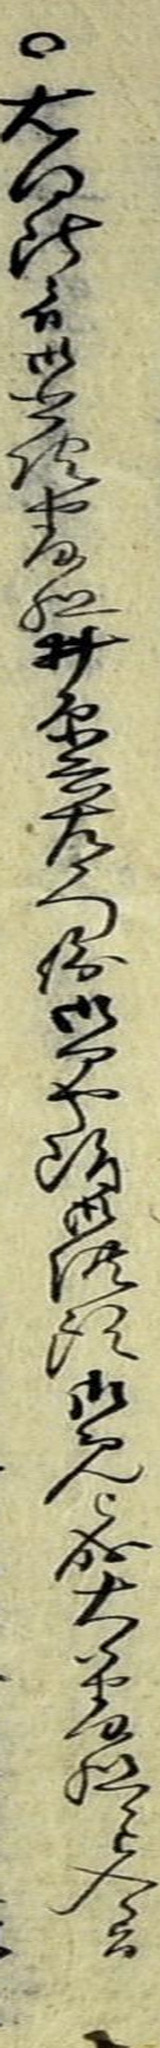〇右同断に付御書院番組井原兵左衛門儀御部や附御供頭御免被成大番組へ被入候旨
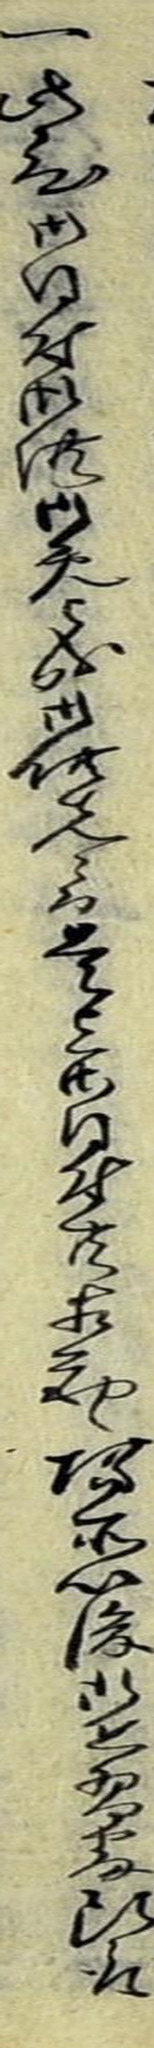一此度御目付御供御免被成御供先に而是迄御目付共相勤候場所以後御近習番頭取
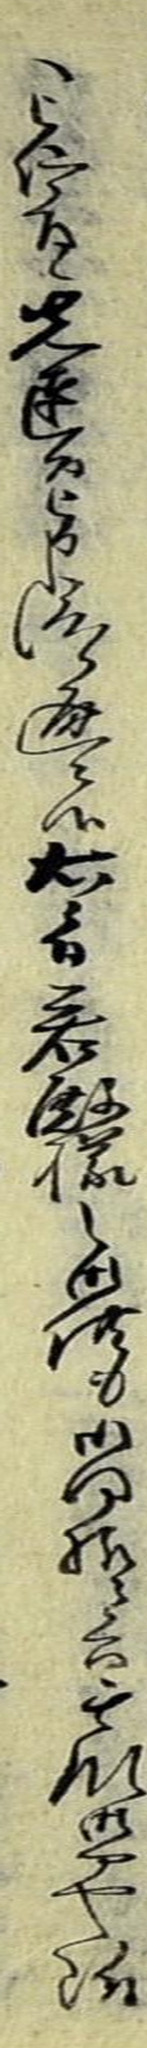へ被仰付候先達而被申渡候通に候右に付若殿様之御供も御同様に候間其段御部や附
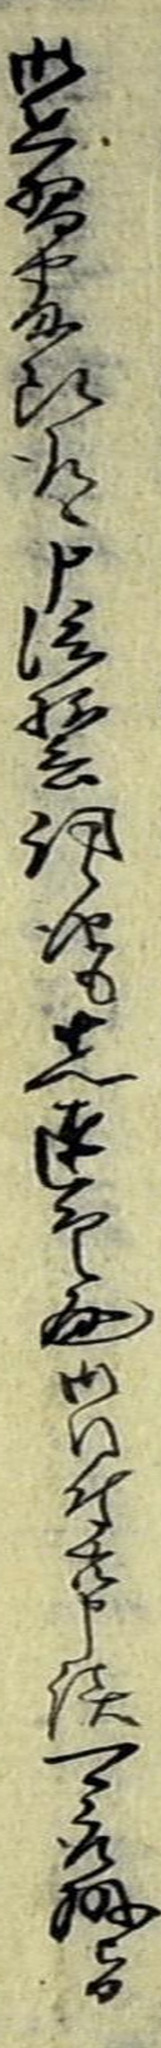御近習番頭取へ申渡誓詞之儀も先達而之通御目付共申談可取扱旨
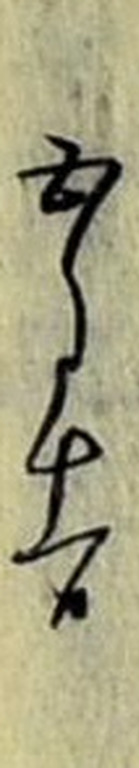五月十一日

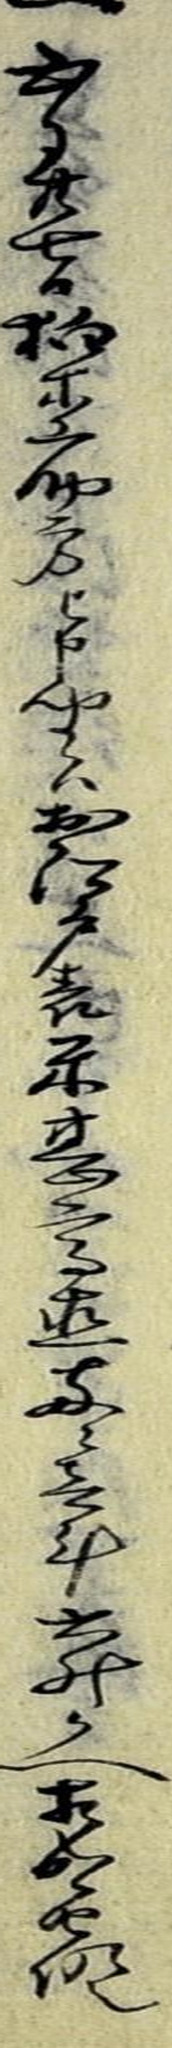一五月廿七日狛杢助方被申聞候は於江戸表米甚高直両に壱斗六升かへ相成候由仍之
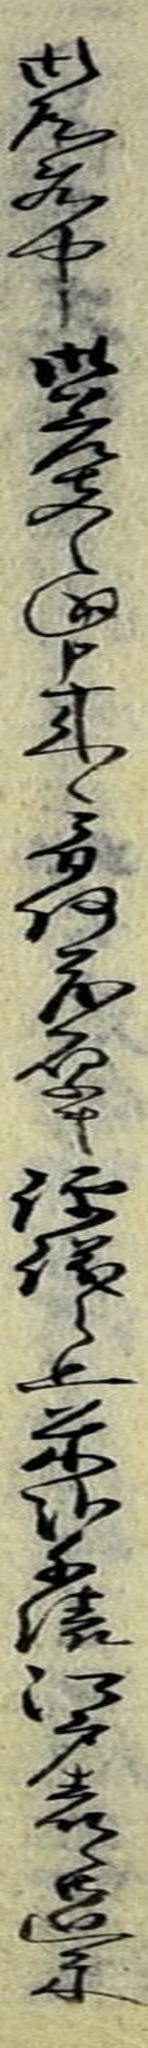御屋敷中御差支之趣申来候に付何茂厚き評議之上米弐千俵江戸表へ御廻米
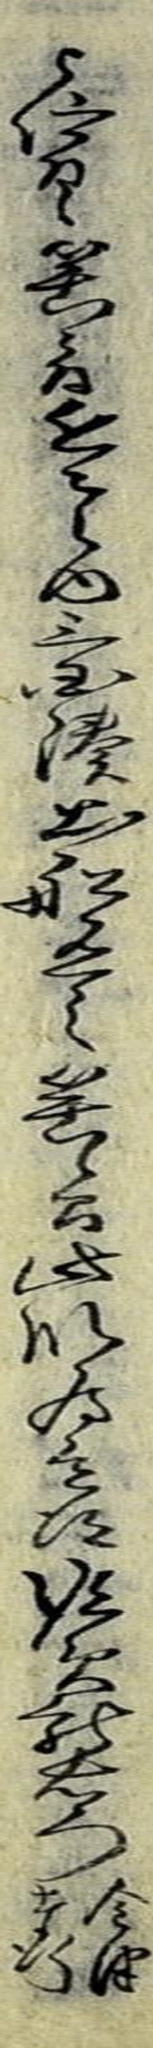被仰付候筈に付近々之内三国出船有之筈候間此段為意得渥美新右衛門金津奉行
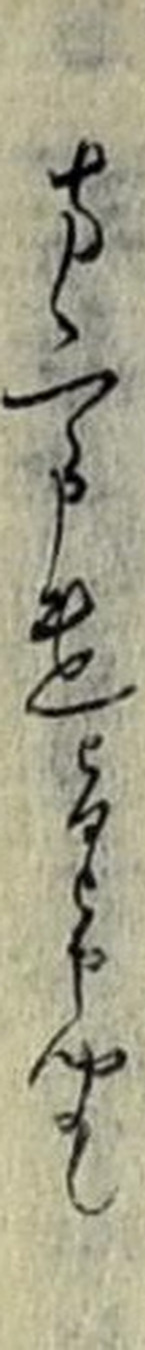方へ可申遣旨被申聞候
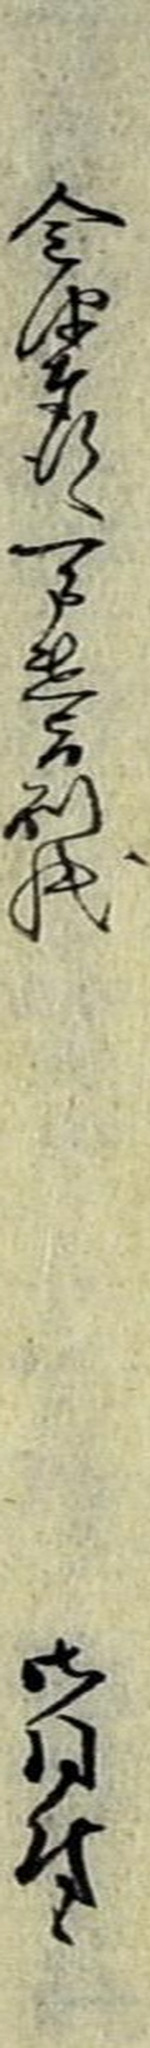金津奉行へ可申遣旨別紙御目付へ
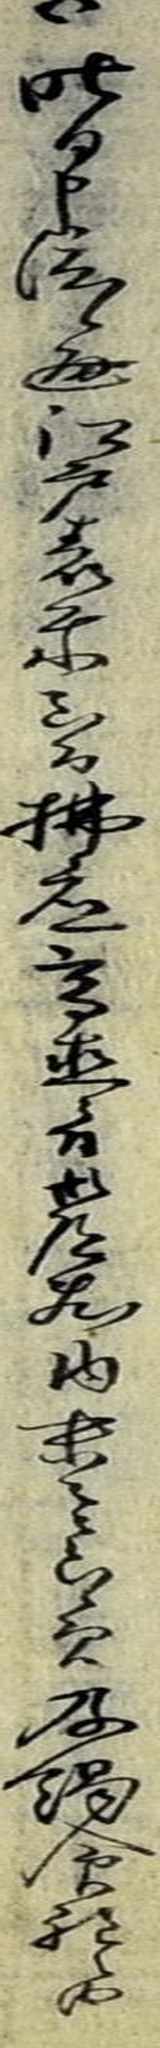〇昨日申渡候通江戸表米至而払底高直に付御屋敷内末々に至候而は及渇食程之由
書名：命令之部 二
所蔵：福井県文書館 Fukui Prefectural Archives
